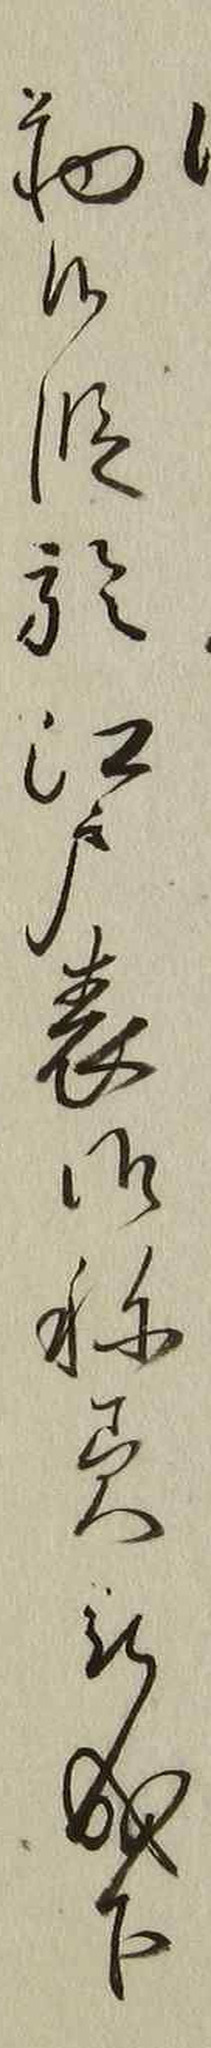勤候段於江戸表御称美被成下
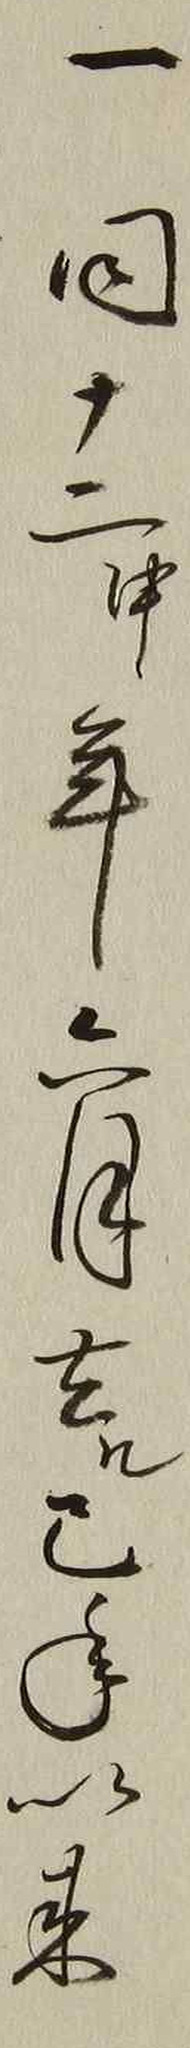一同十二申年六月去ル巳年以来
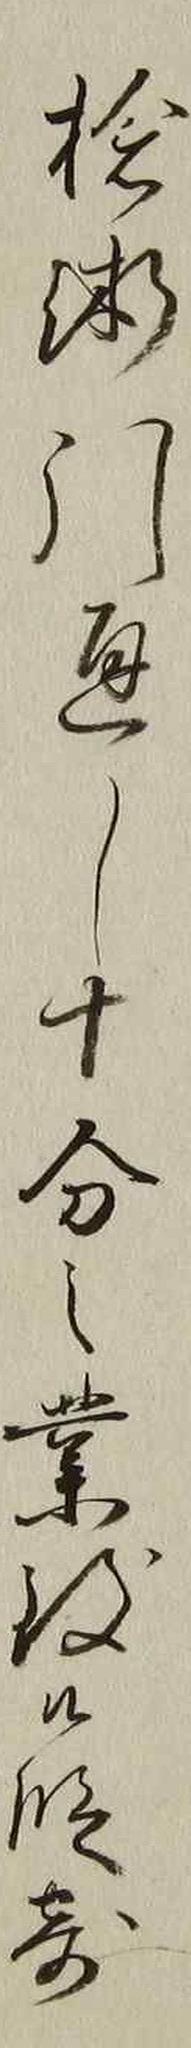槍術引通し十分之業致候段奇
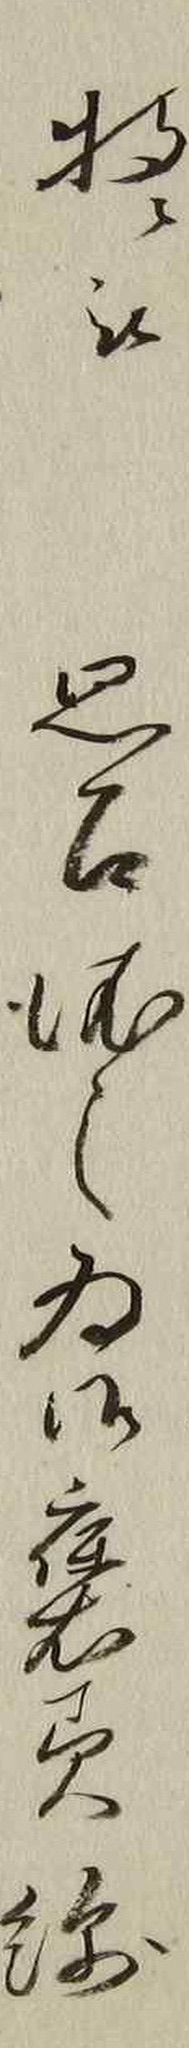特に被思召依之為御褒美綿
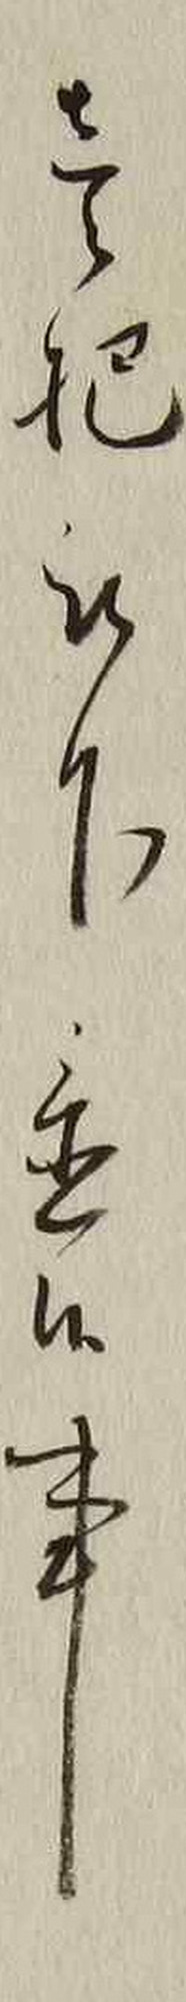壱把被下置候事
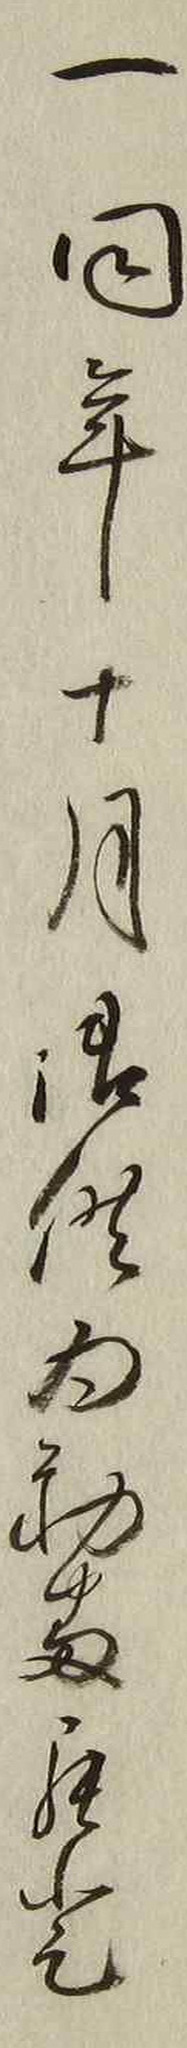一同年十月御供為勤番罷登
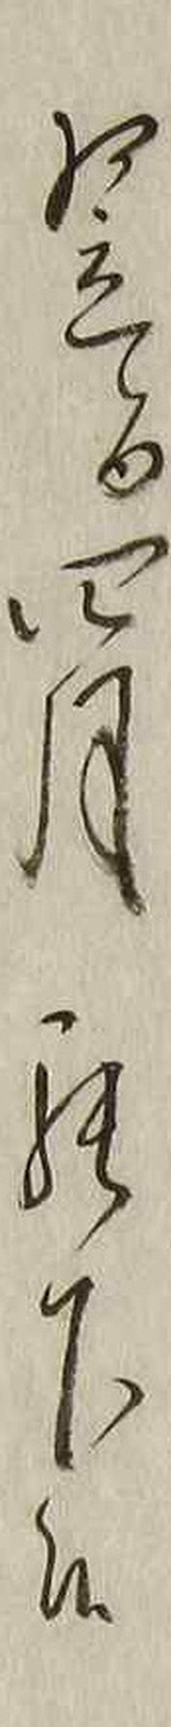翌酉四月罷下候
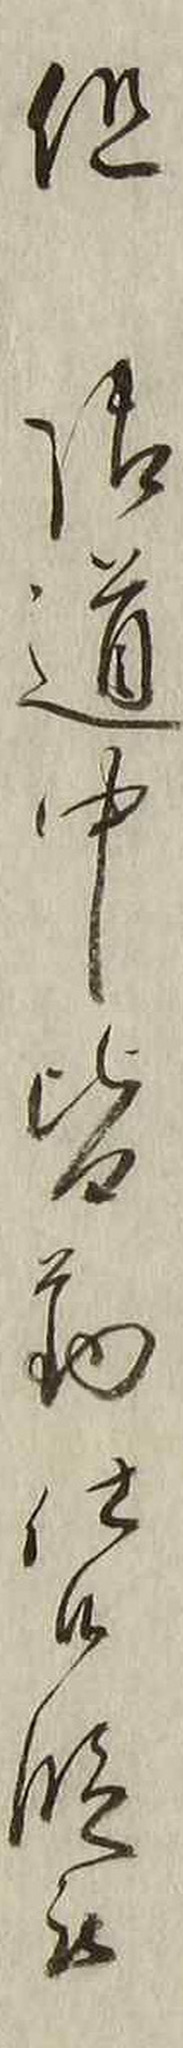但御道中皆勤仕候段被
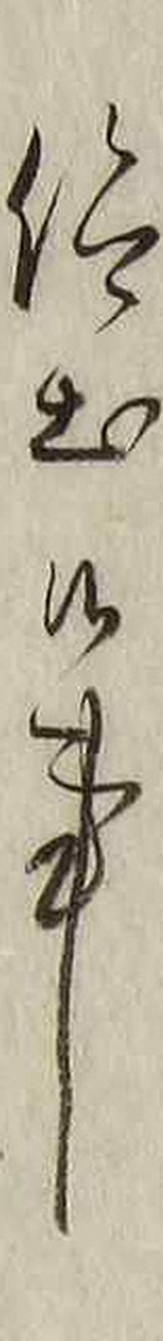仰出候事
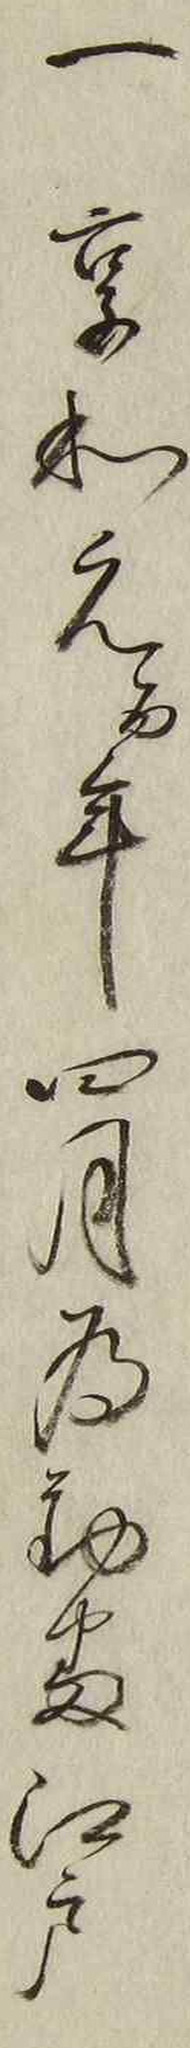一享和元酉年四月為勤番江戸
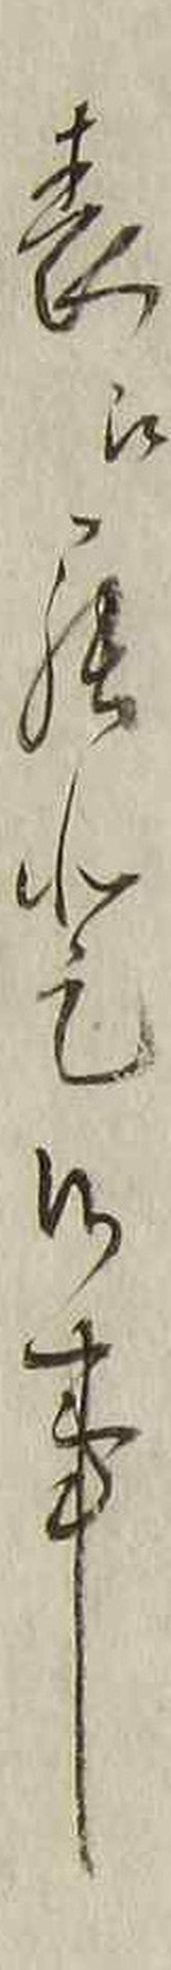表江罷登候事

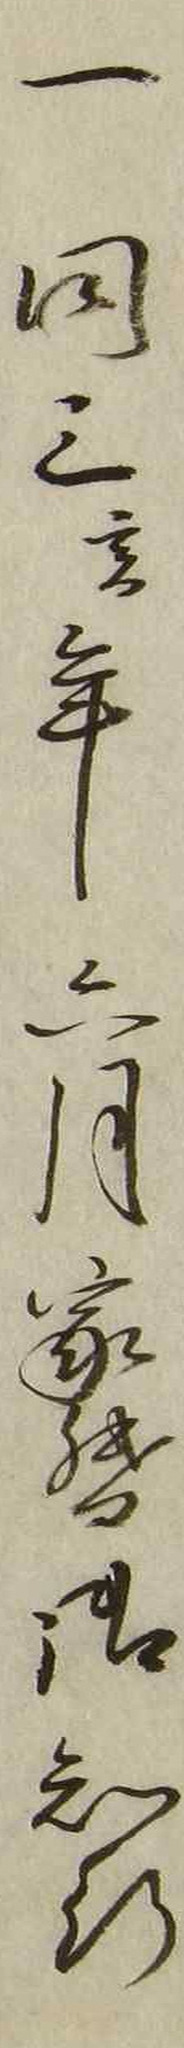一同三亥年六月家督御知行
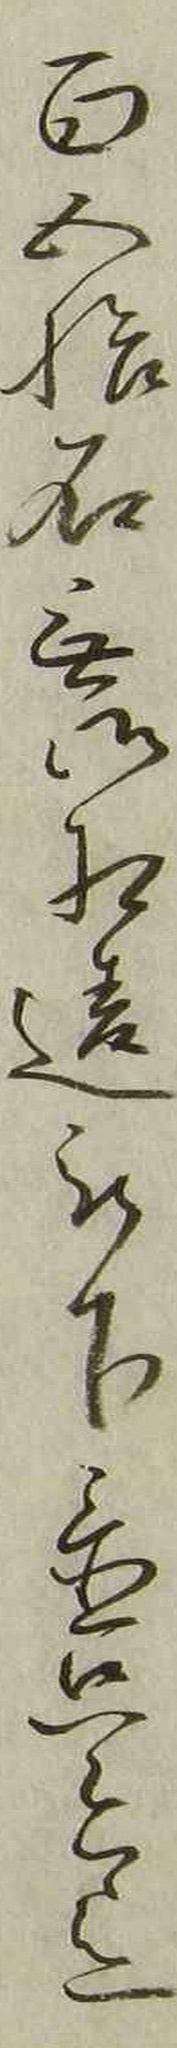百五拾石無御相違被下置只今迄
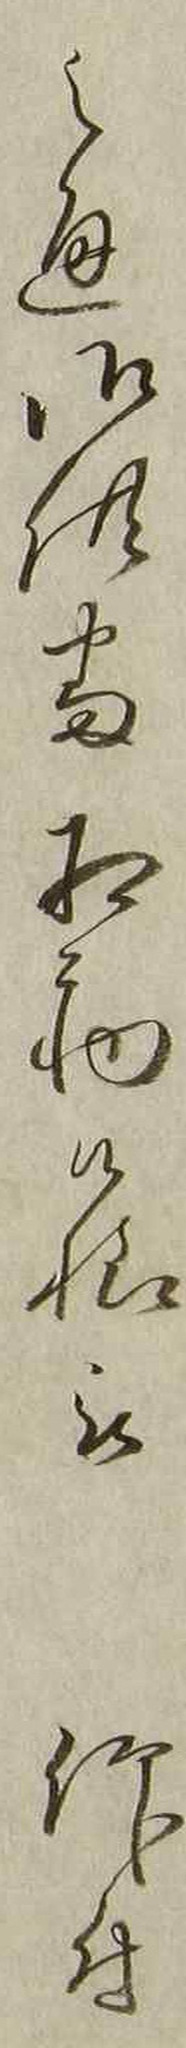之通御供番相勤候様被仰付
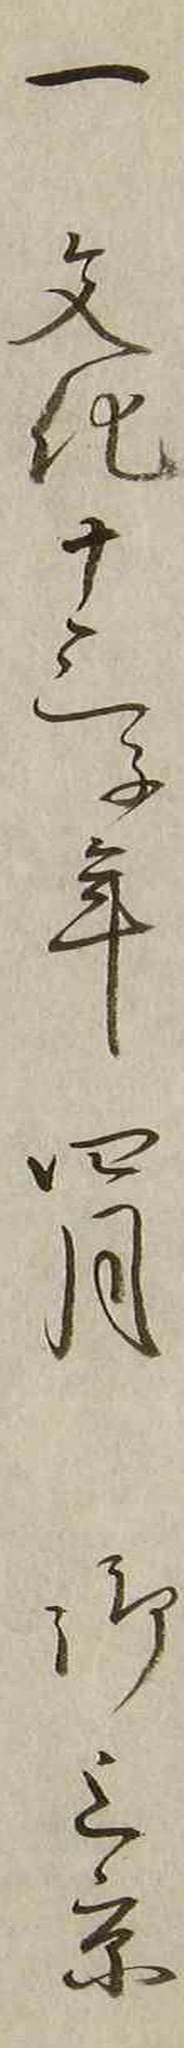一文化十三子年四月御上京
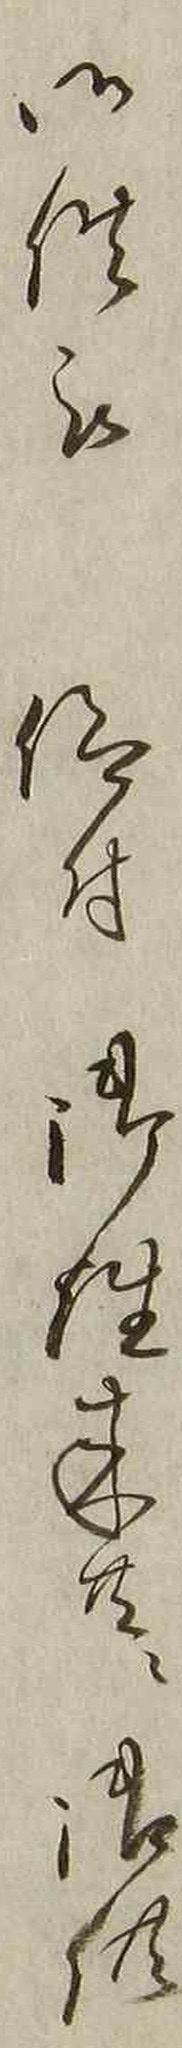御供被仰付御往来共に御供
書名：諸士系譜　巻之6　い之部6
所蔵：会津若松市立会津図書館
